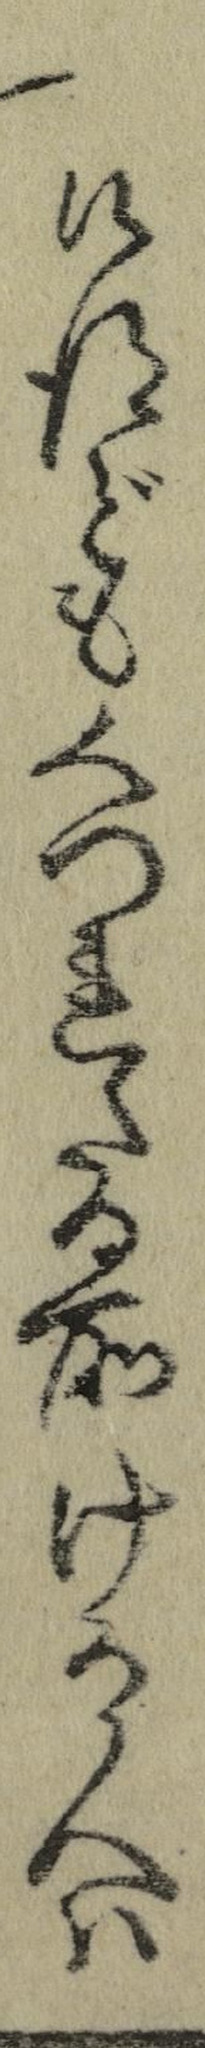候得どもくつれたる所けか人は
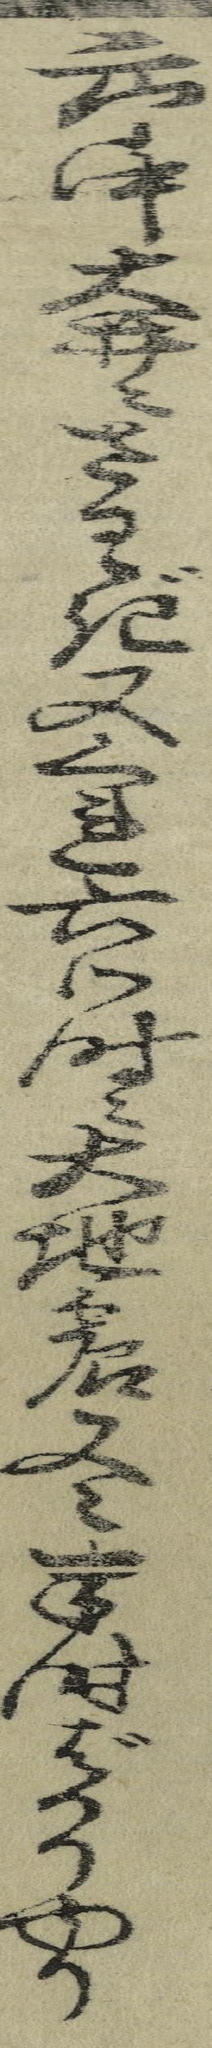市中大井にさわぎ又くれ六ツ時に大地震又〻半時ばかりゆり
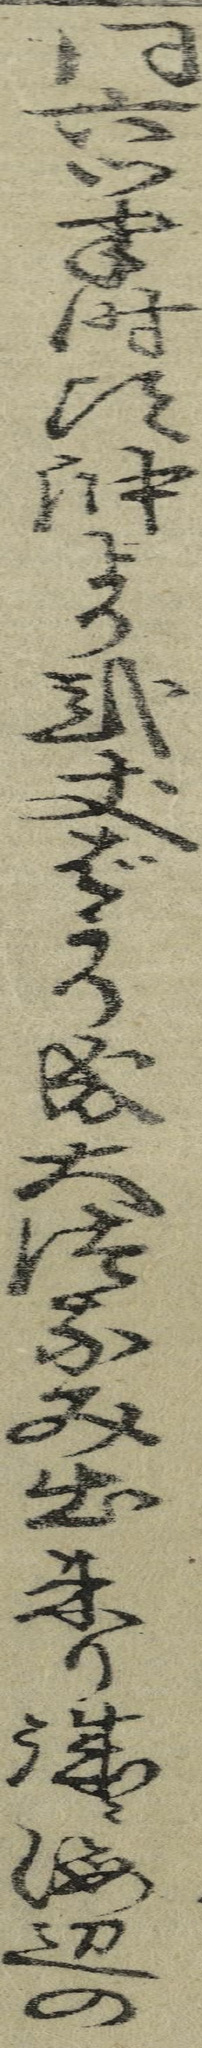同六ツ半時頃沖より弐丈ばかり成大つなみ出来り殊に海辺の
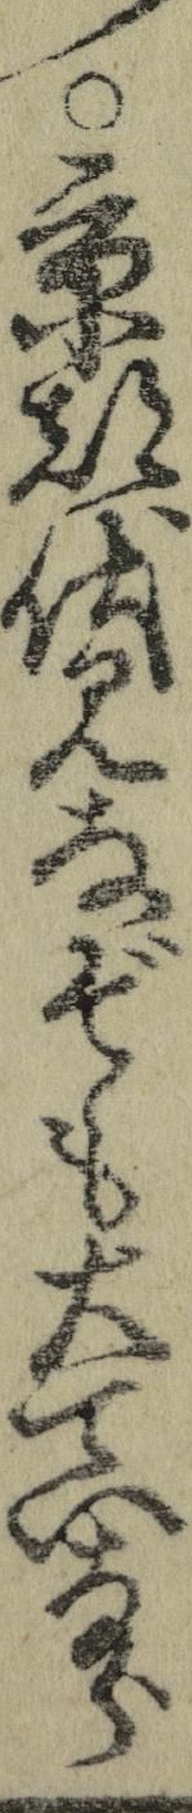〇京都伏見なぞも大ていなら
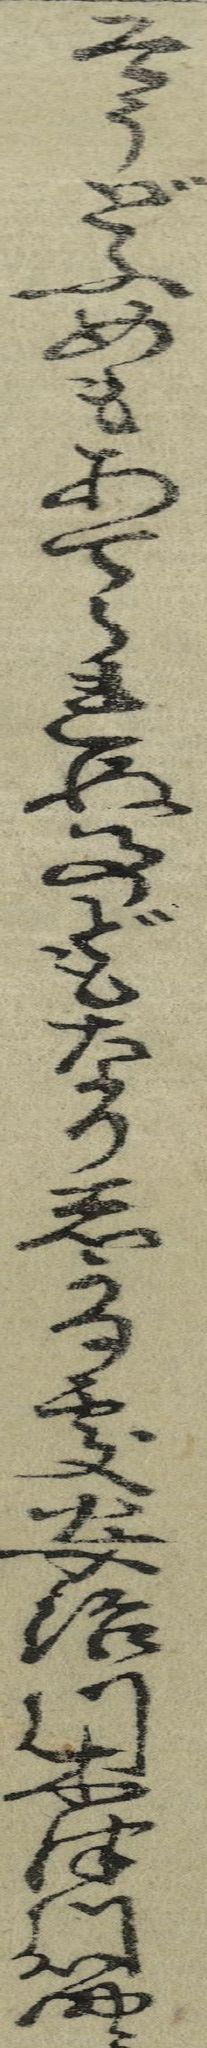そうどふめもあてられぬ事どもなりしかる処安治川木津川筋に
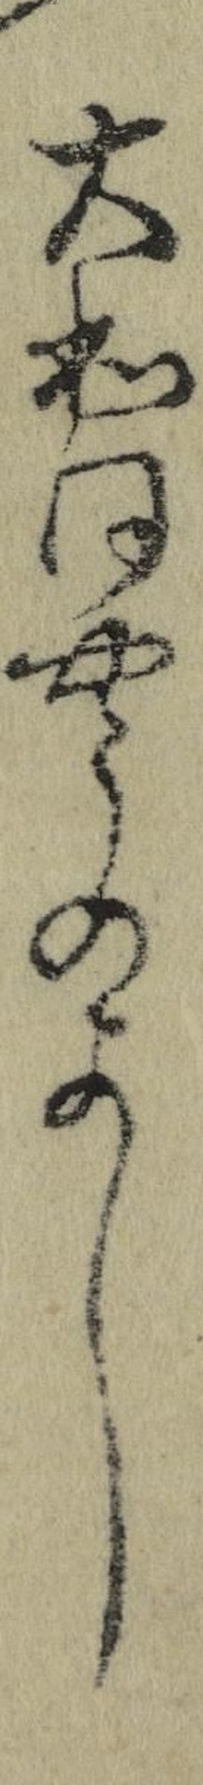大和同やうのよし
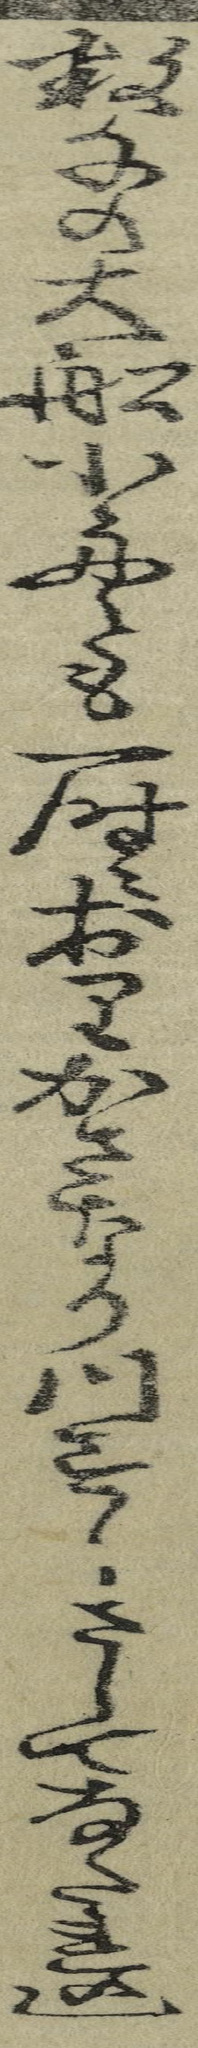数千の大船小舟とも一時におりかさなり川すしさしてなたれ込
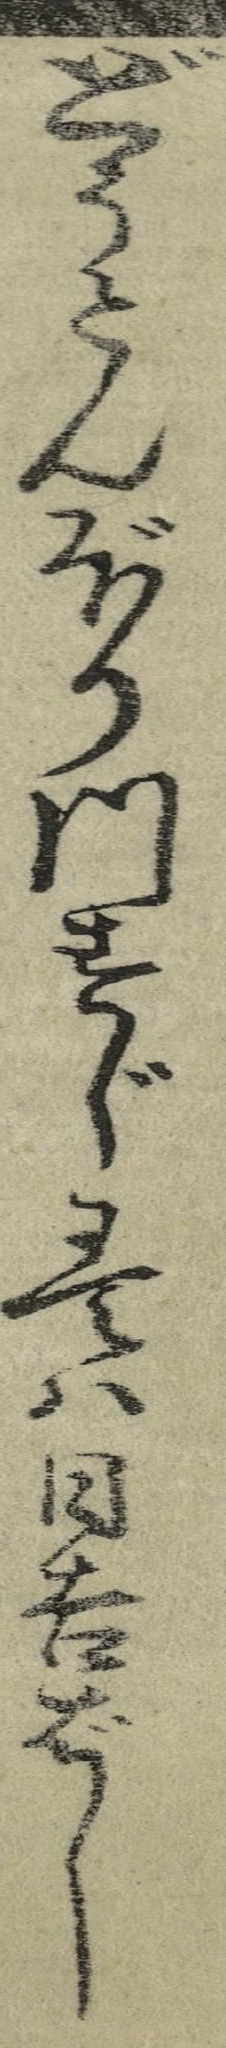どうとんぼり川すじにては日吉ばし
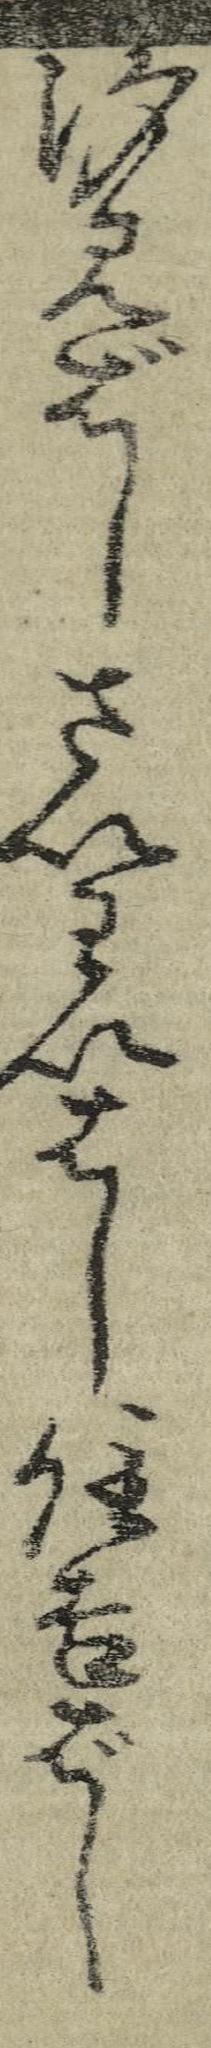汐見ばしさいわいはし住吉ばし
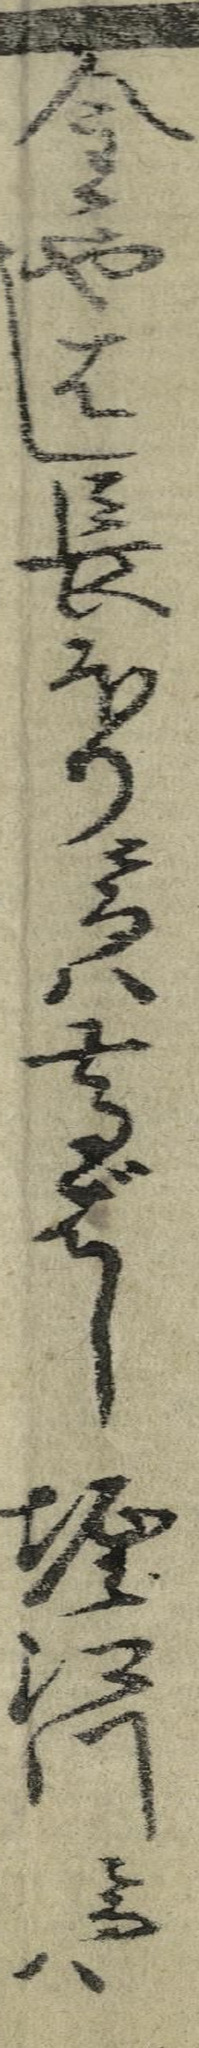今みやはし長ほりに而は寺ばし堀江川に而は
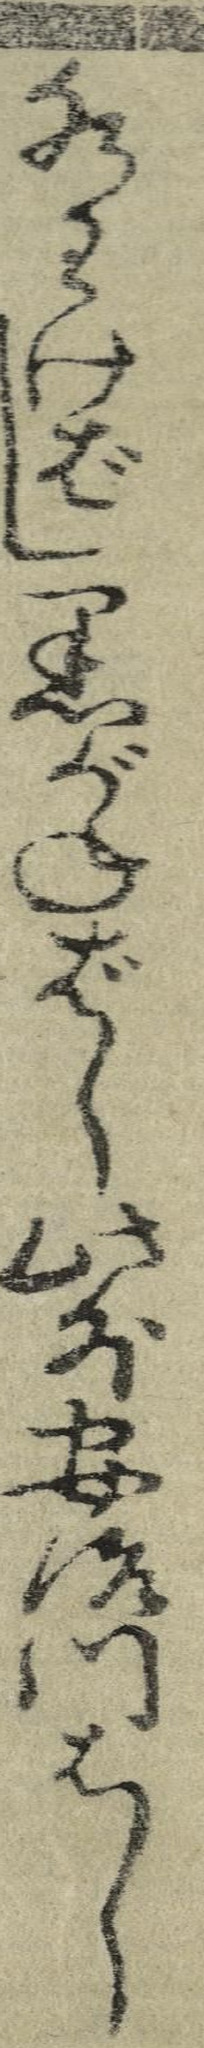水わけばし黒がねばし此外安治川はし
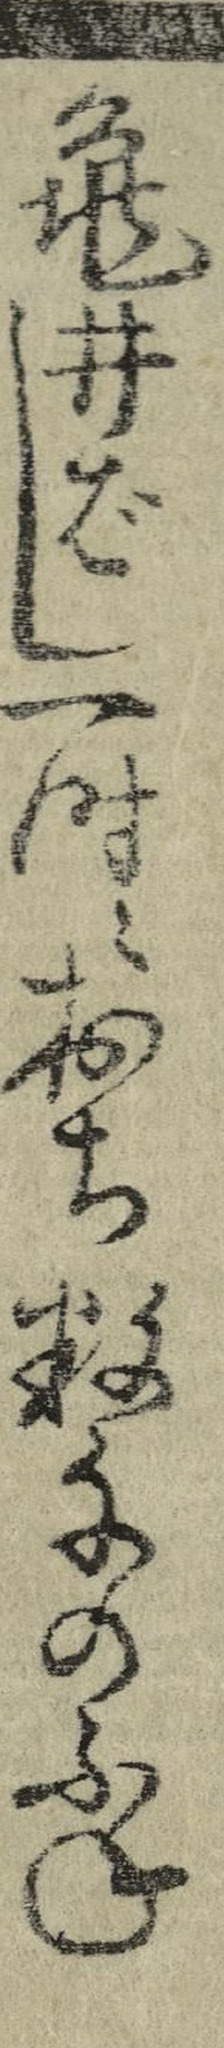亀井ばし一時におち数千のふね
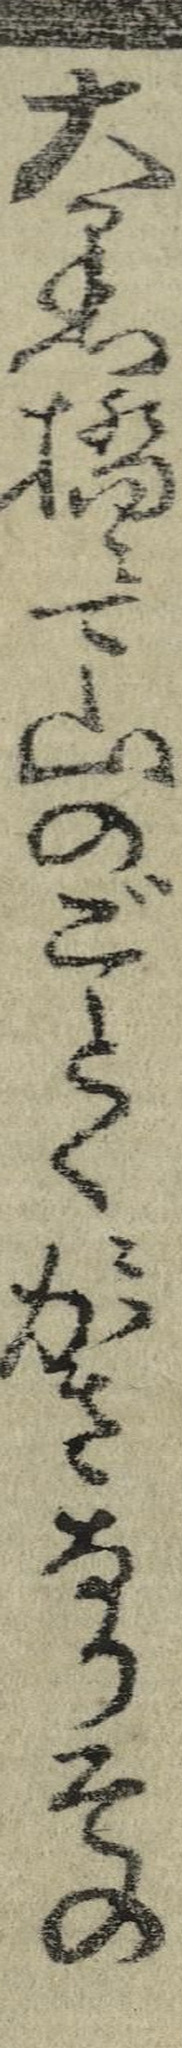大黒橋にて山のごとくにかさなりその
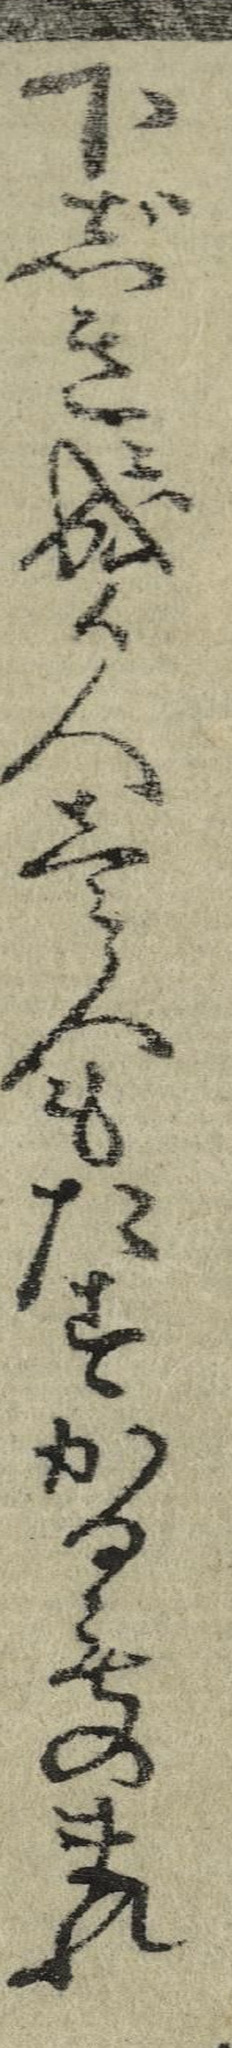下じきに成る人壱人もたすかるものまれ
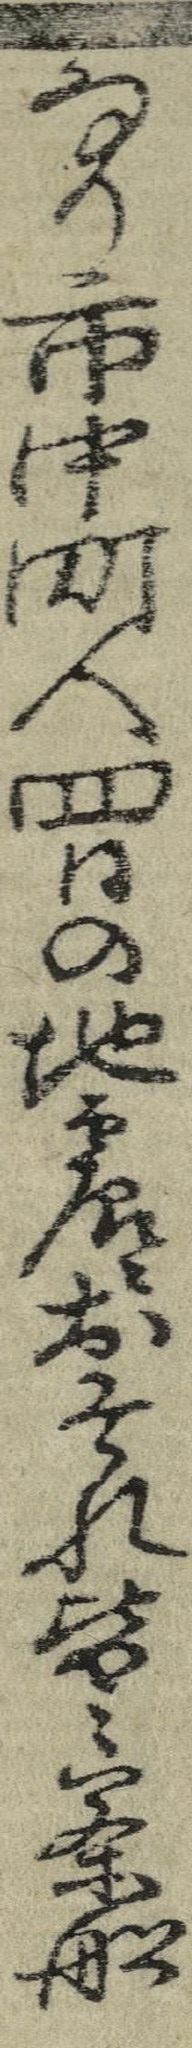なり市中町人四日の地震おそれ皆〻茶船
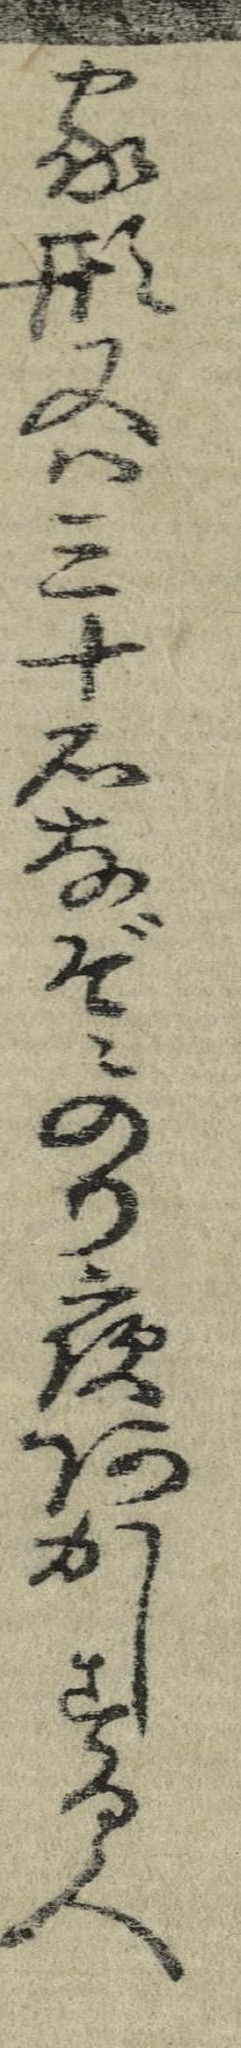家形又は三十石なぞにのり夜あかしする人
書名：摂津大阪近辺早引方角附　大地震ニ附大津波次第
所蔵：東京大学地震研究所図書室 Earthquake Research Institute Library, The University of Tokyo, JAPAN
